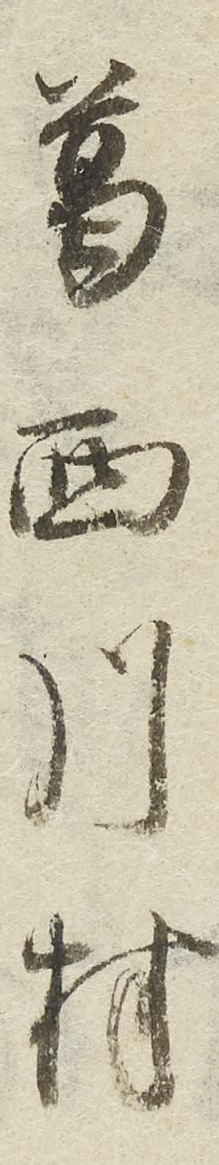葛西川村
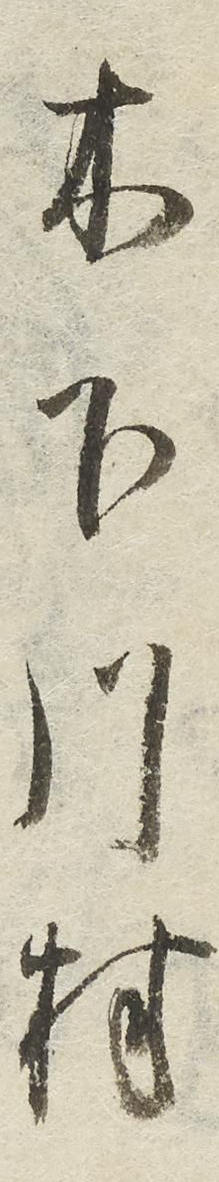木下川村
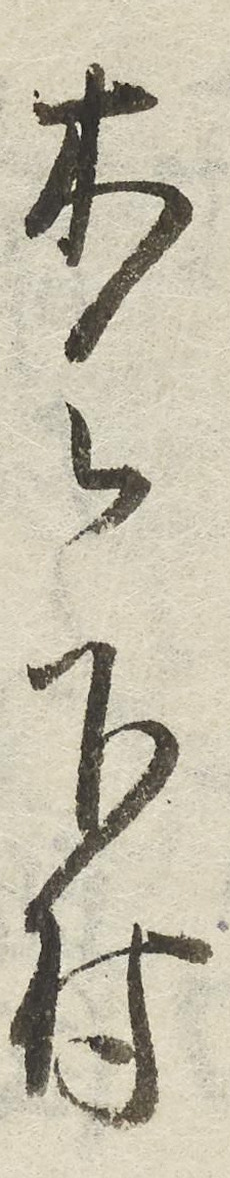木之下村
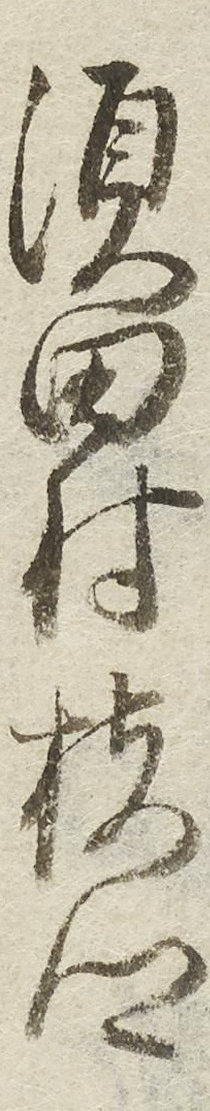須田村枝郷
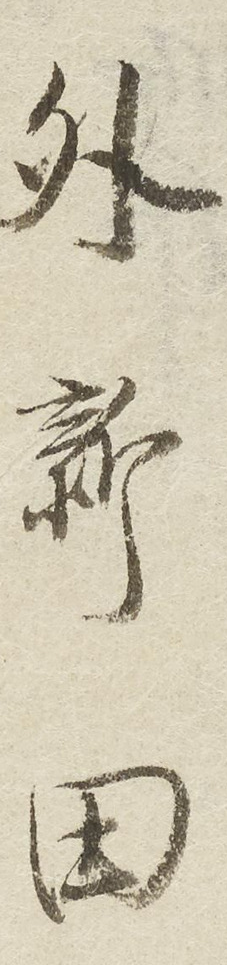外新田
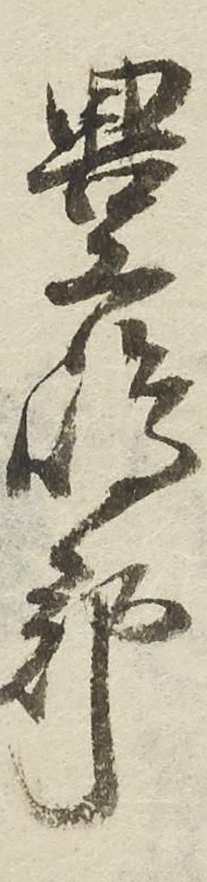豊嶋郡
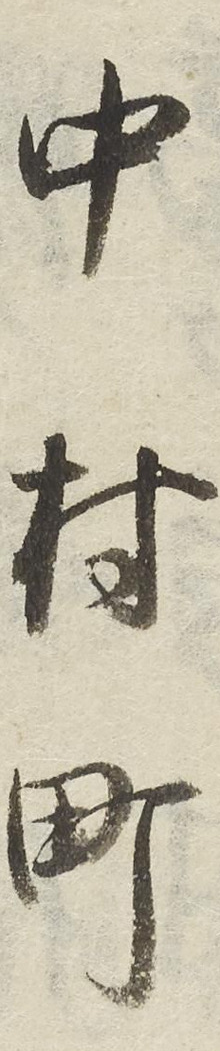中村町
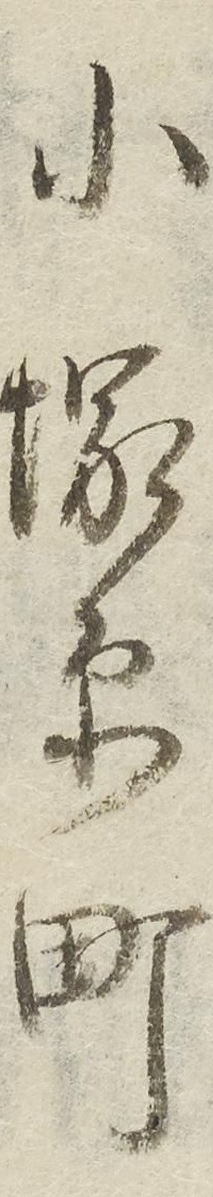小塚原村
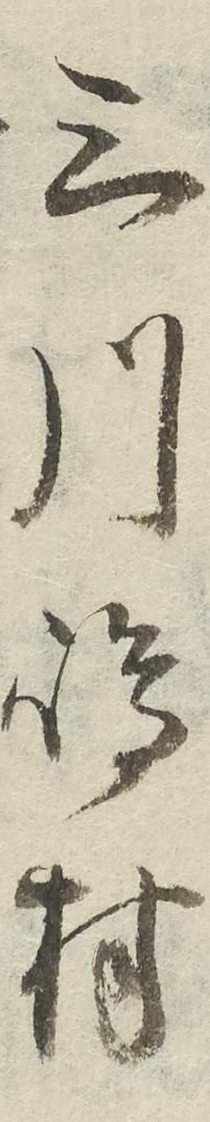三河嶋村
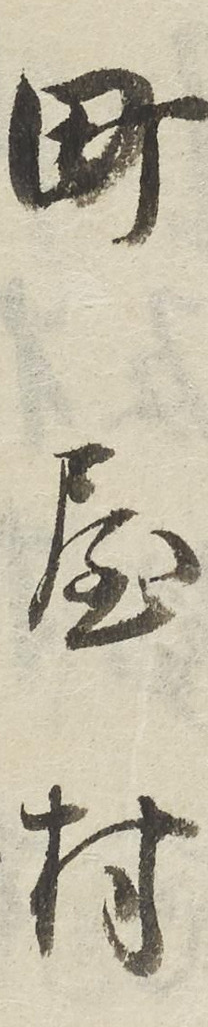町屋村
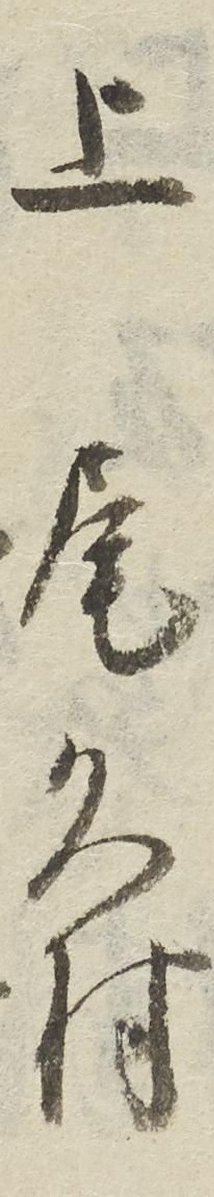上尾久村
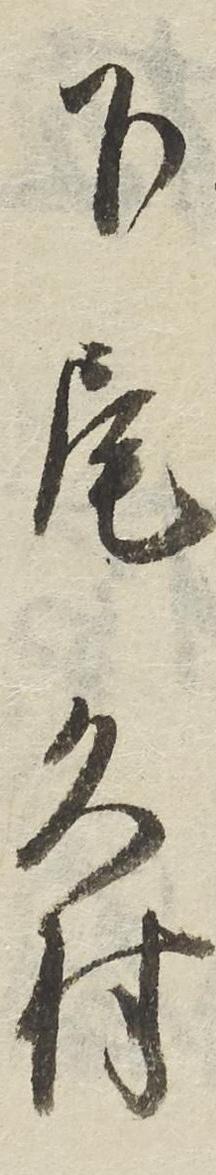下尾久村
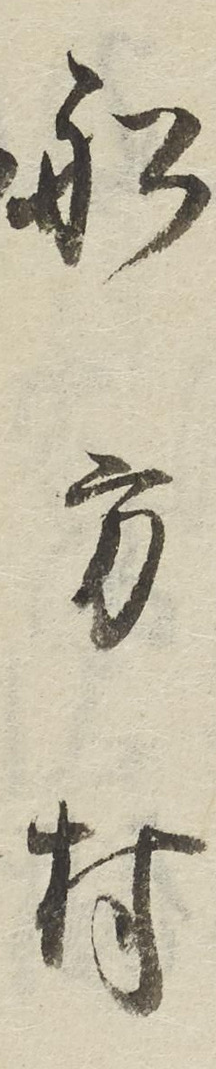船方村
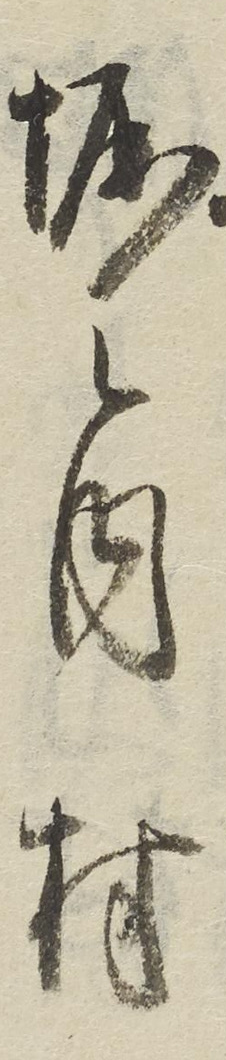堀之内村

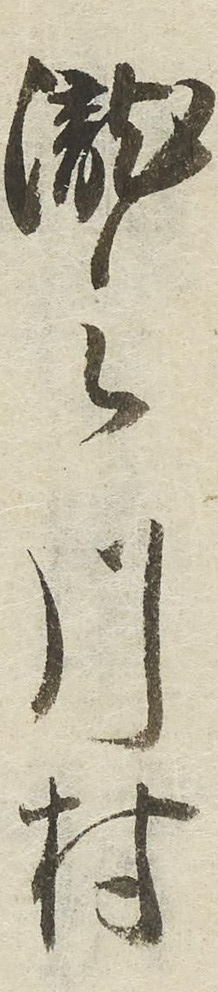瀧之川村
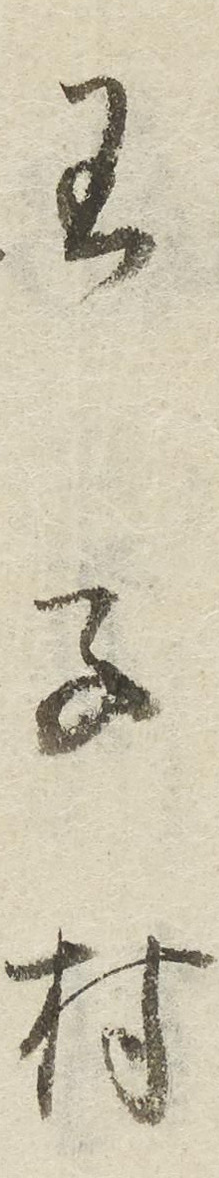王子村
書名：[梵鐘差出一件]
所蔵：東京大学地震研究所図書室 Earthquake Research Institute Library, The University of Tokyo, JAPAN
